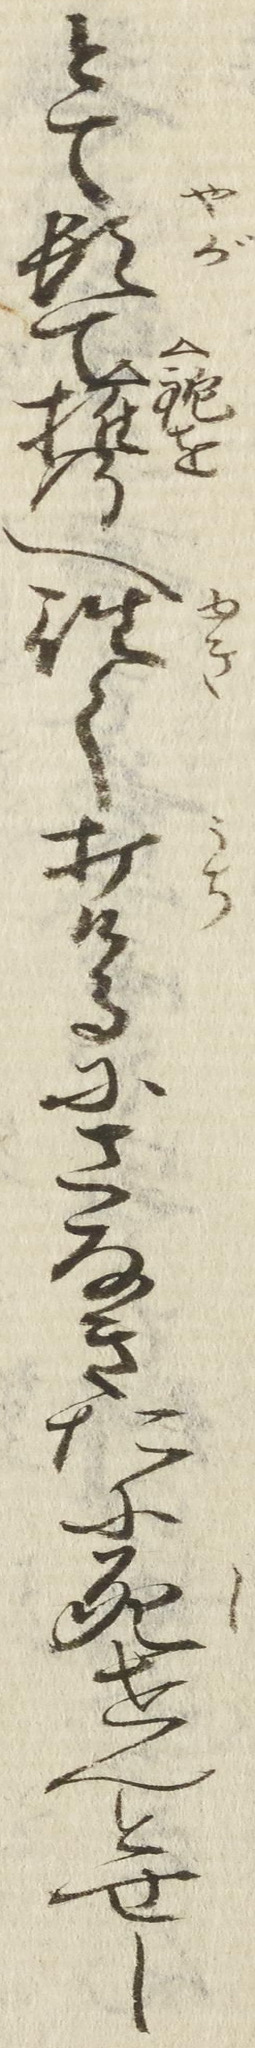とて頓て△鉈を携へ往て打けるにさなきたに死せんとせし
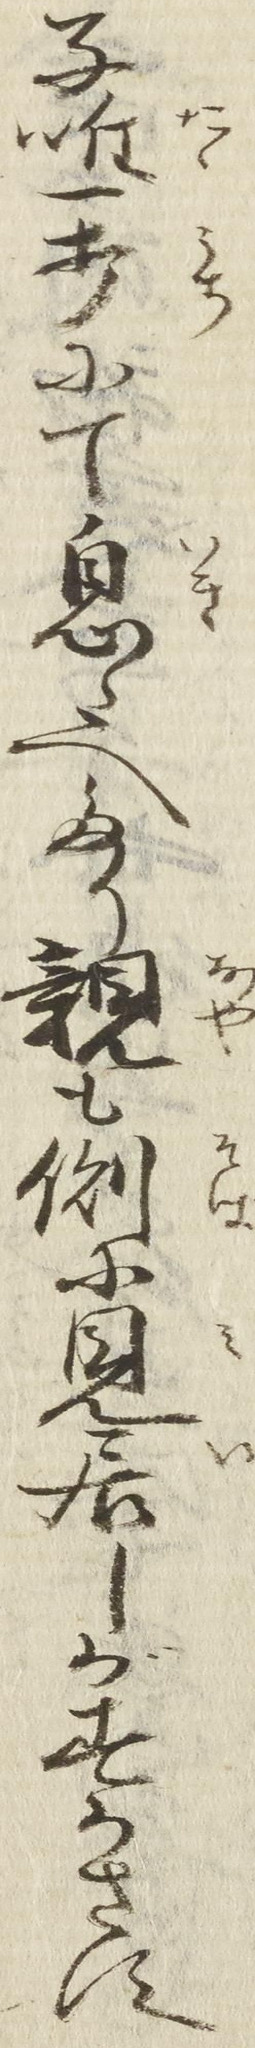子唯一打にて息たへたり親も側に見居しがすかさす
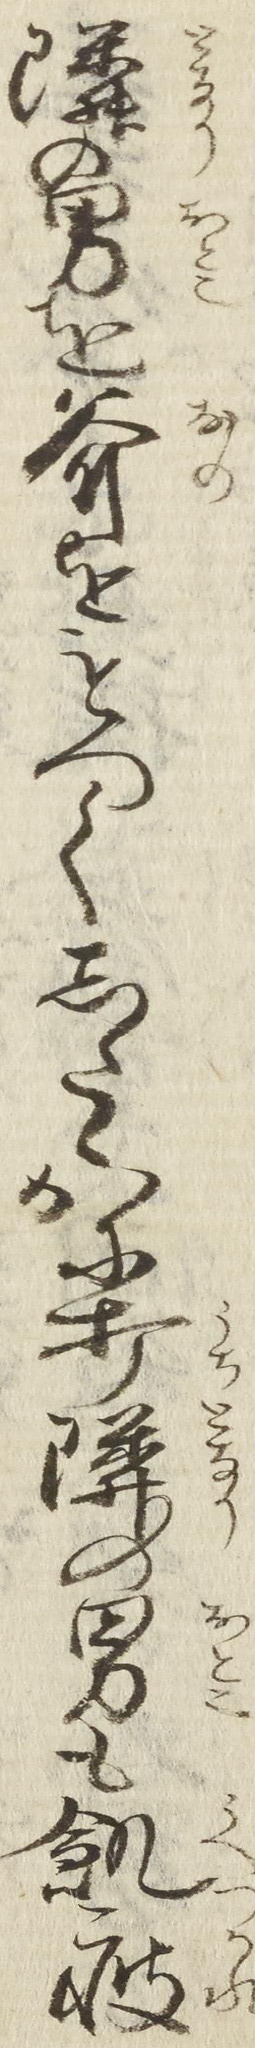隣の男を斧をもつてしたゝかに打隣の男も飢疲
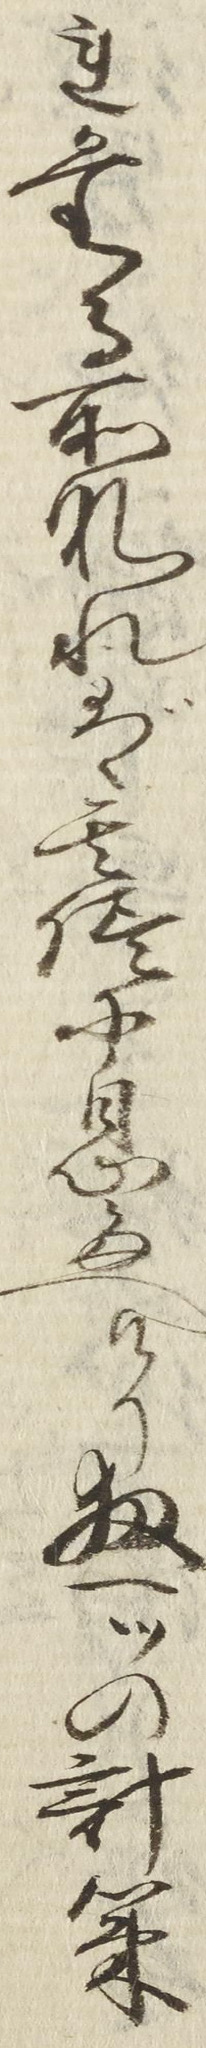れたる所那れば其侭に息たへけり扨一ツの計策
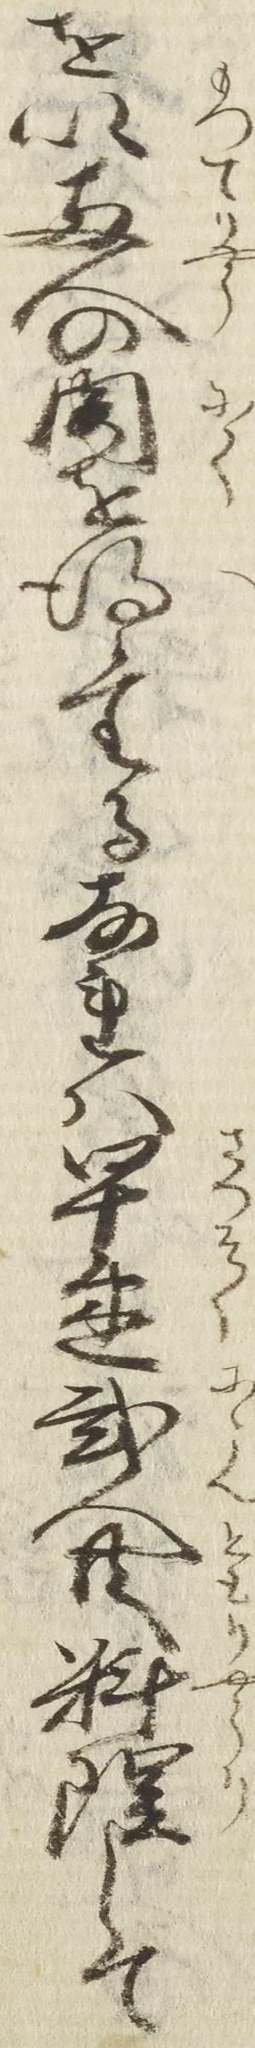を以両人の肉を得たるなれは早速弐人共料理して
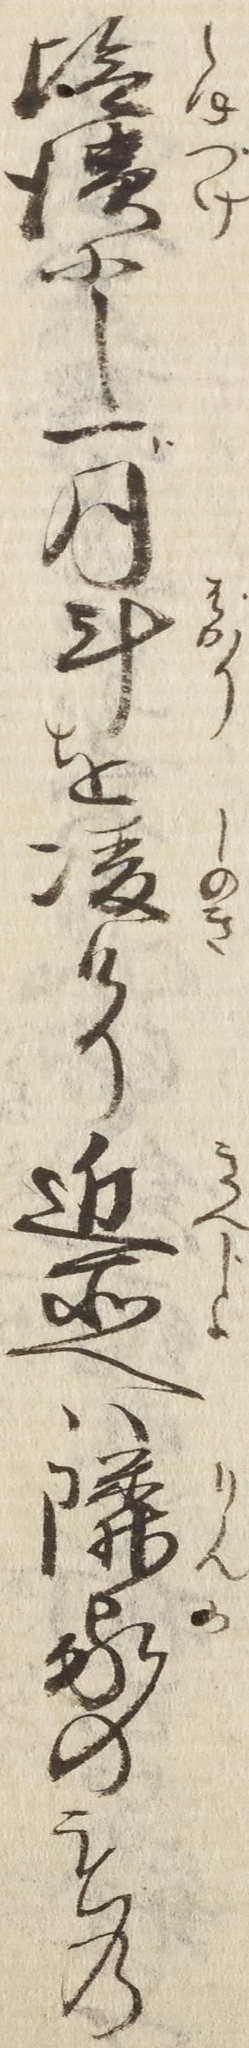塩漬にし一月斗を凌けり近所へは隣家のもの
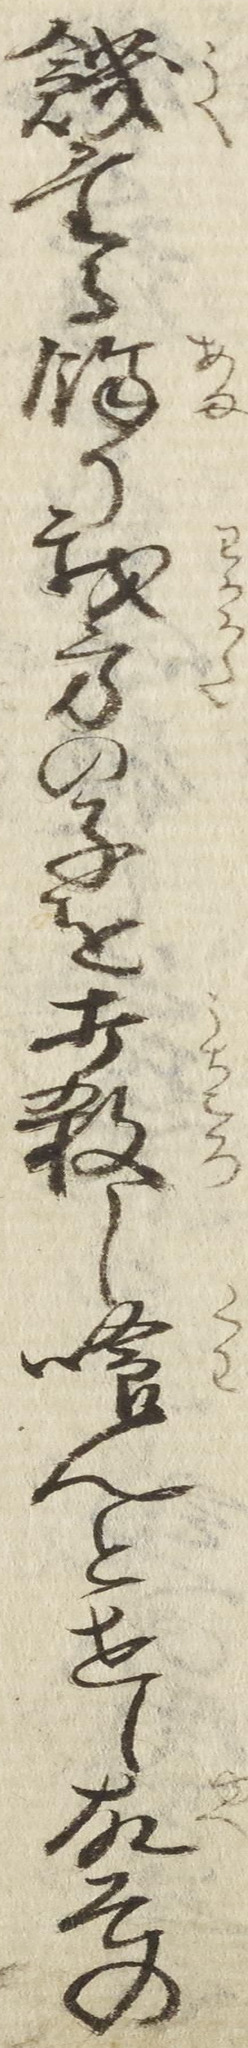餓たる余り我方の子を打殺し喰んとせし故その

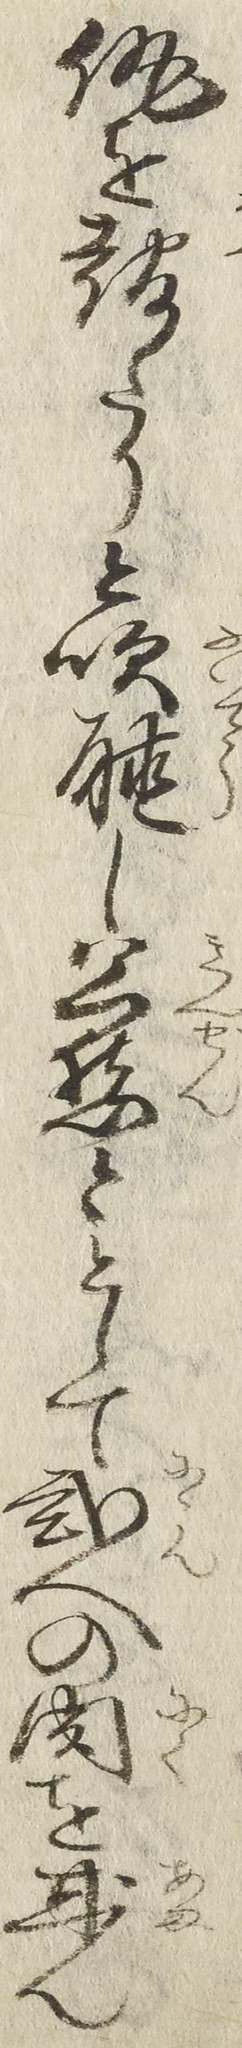仇を報たりと吹聴し公然〻として弐人の肉を甘ん
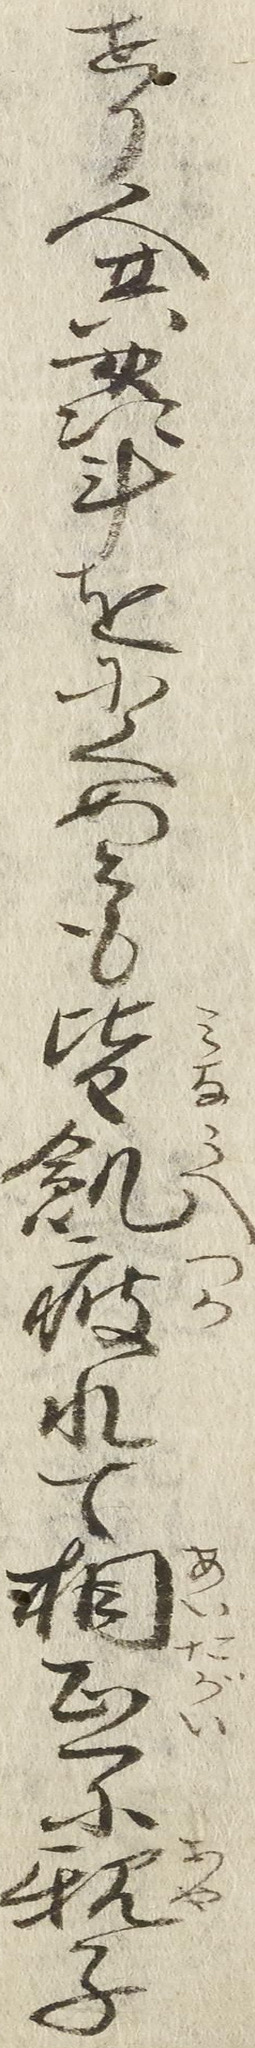せり人其姦計をにくめとも皆飢疲れて相互に親子
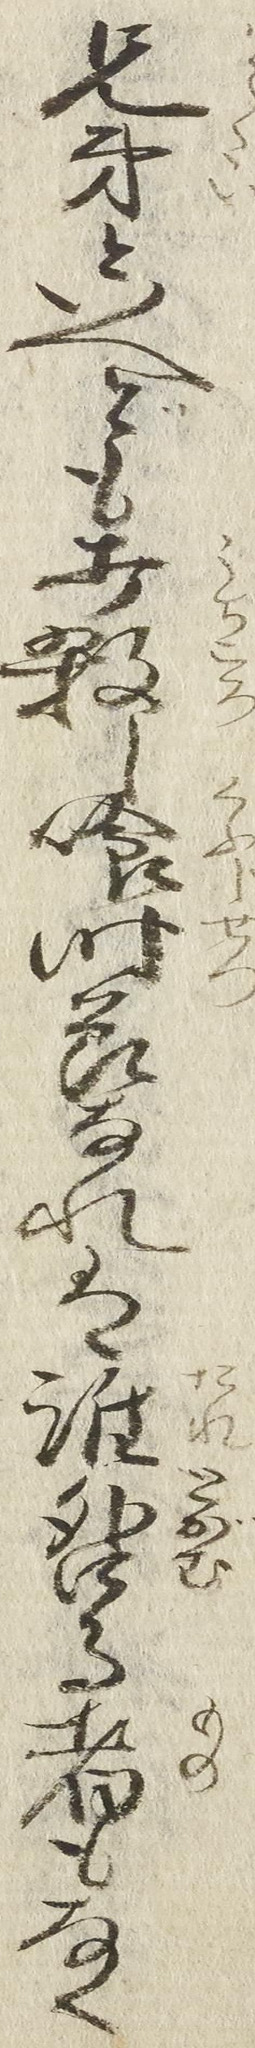兄弟といへども打殺し喰時節なれは誰咎る者もなく
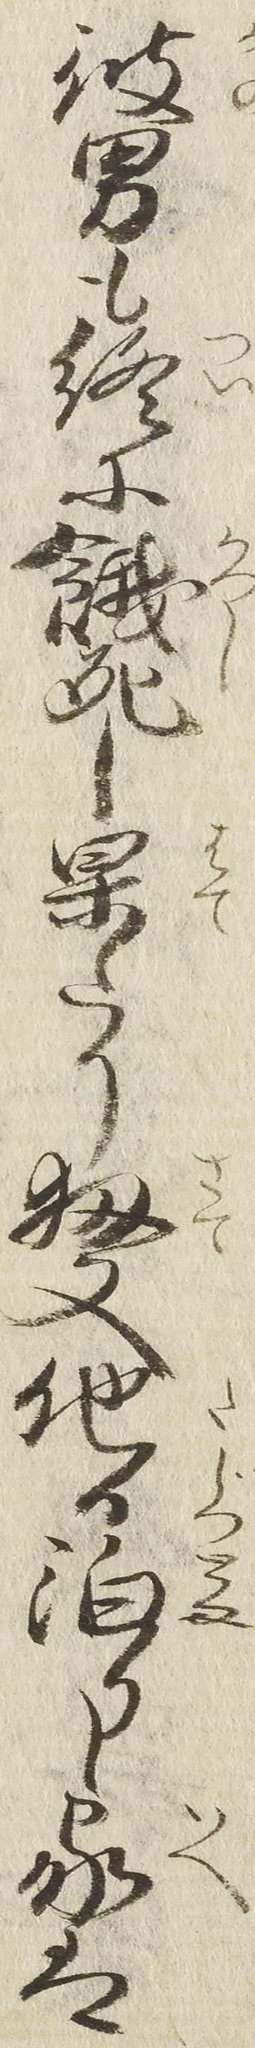彼男も終に餓死し果たり扨又他日泊りし家は
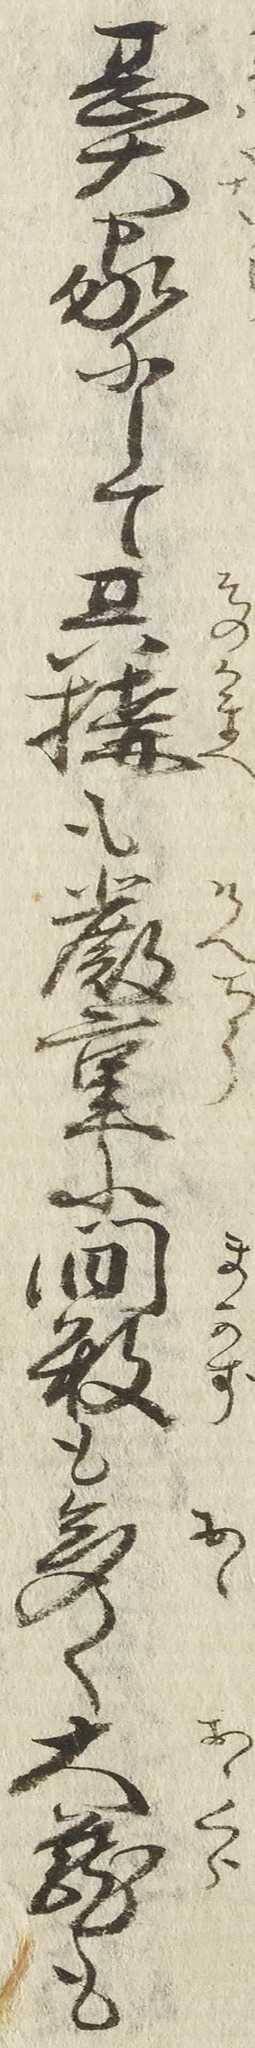甚大家にして其構も厳重に間数も多く大蔵も
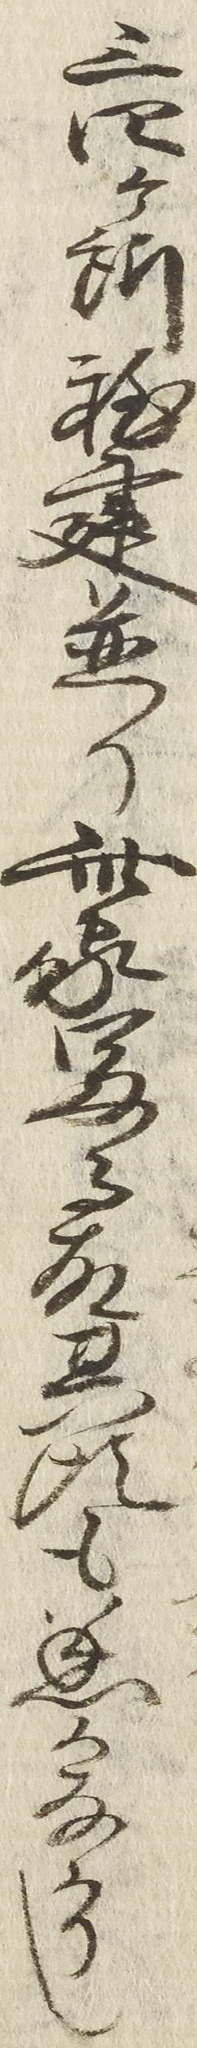三四ケ所程建並り此家富る故其頃も恙かなかりし
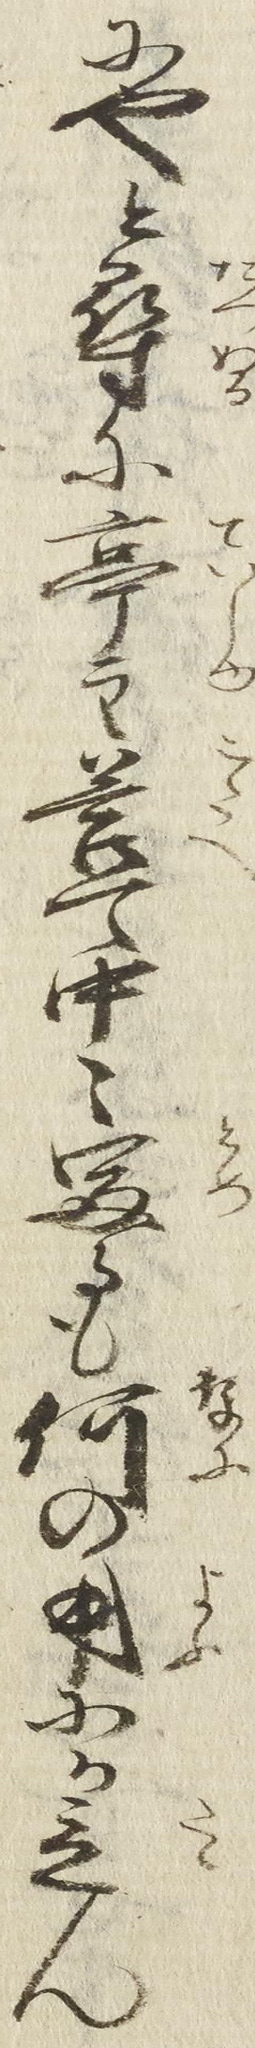にやと尋に亭主答て中〻富るも何の用にか立ん
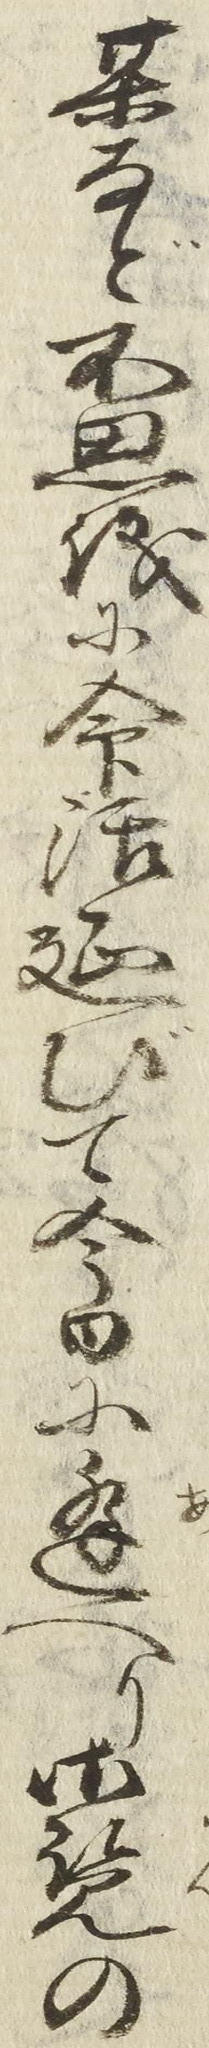某など不思議に命活延びて今日に逢へり御覧の
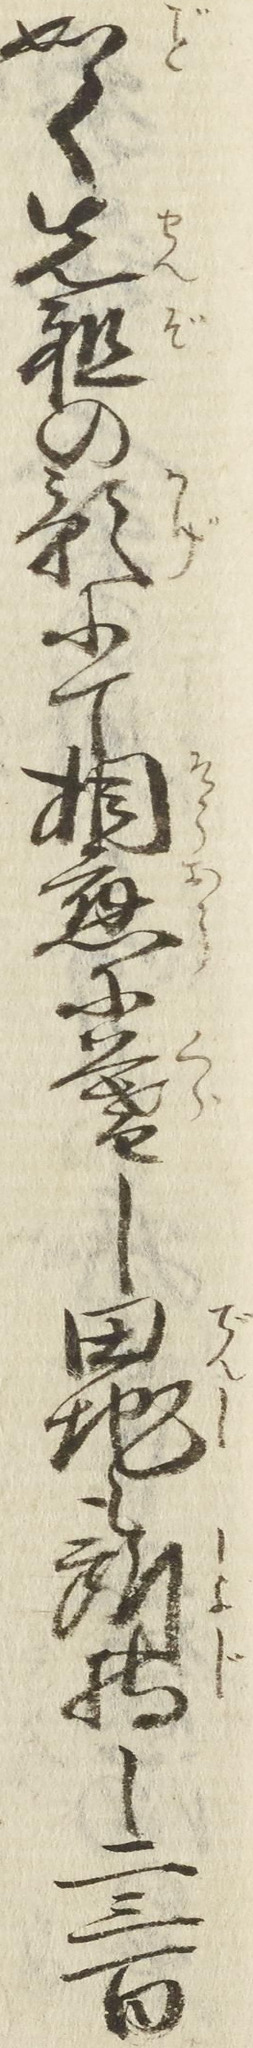如く先祖の影にて相応に暮し田地も所持し二三百
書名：天明奇畧　全
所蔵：東京大学地震研究所図書室 Earthquake Research Institute Library, The University of Tokyo, JAPAN
